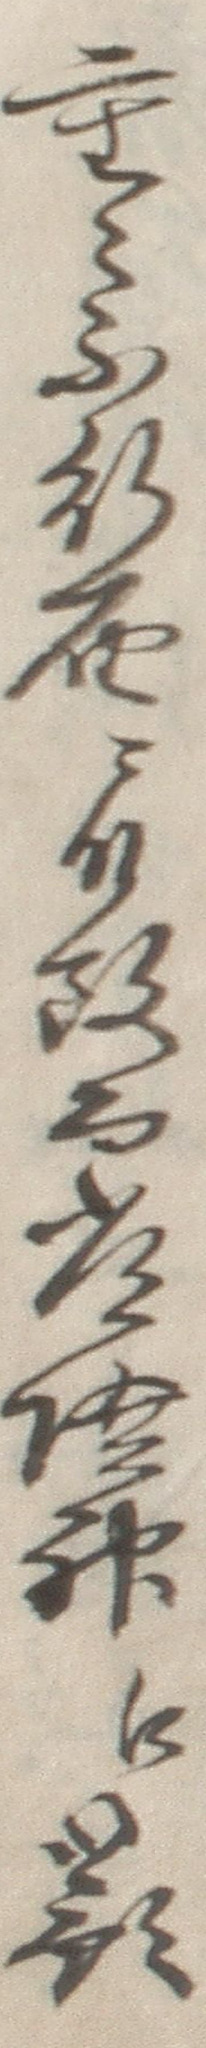重々不行届二付改而常陸神江御預
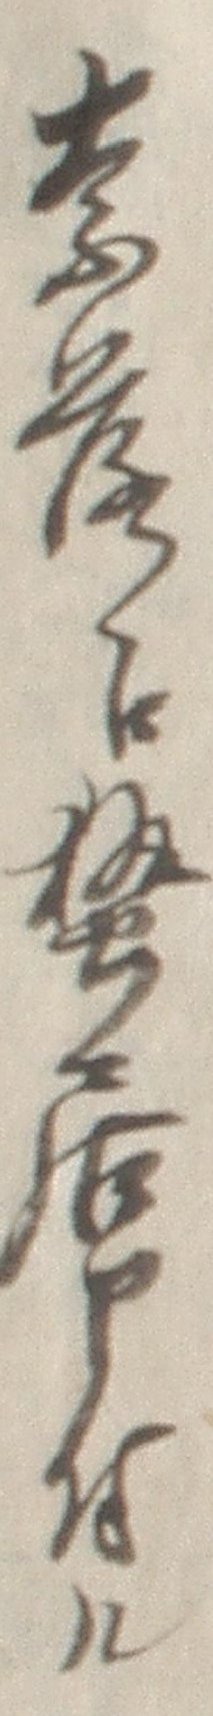奈落江蟄居申付ㇽ

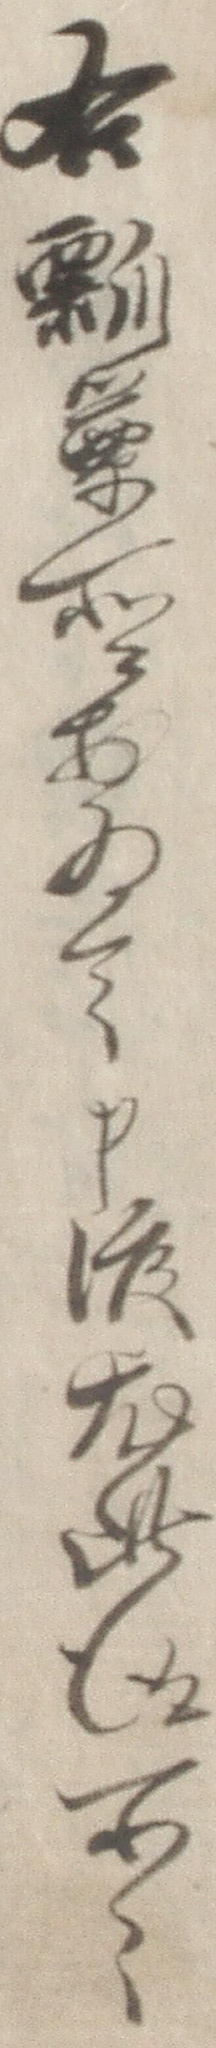右瓢箪所二おゐて申渡尤此趣所々
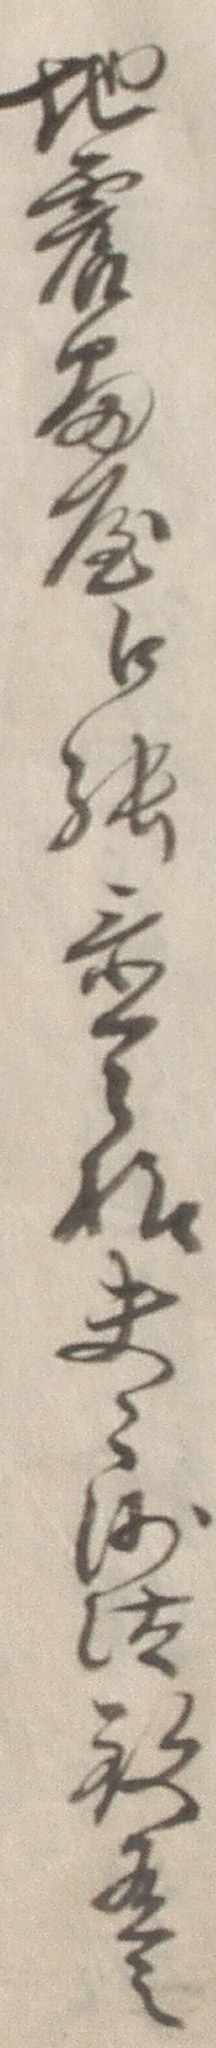地震番屋江張置候様夫々沙汰致有之
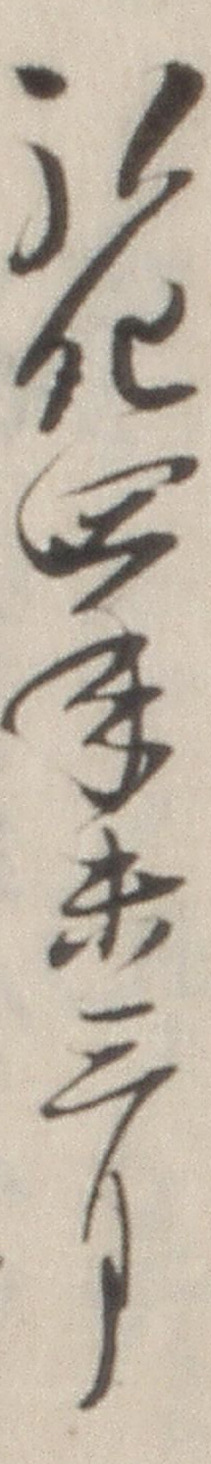弘化四年未三月
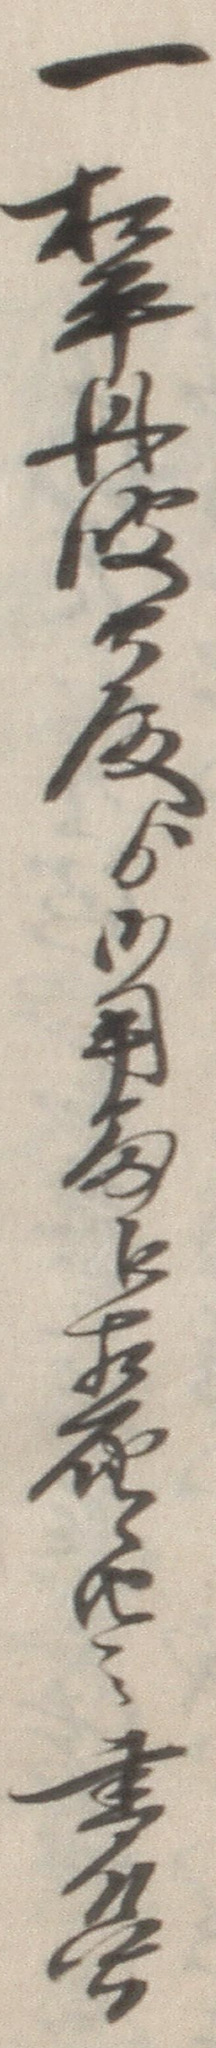一松平丹波守殿ゟ御用番江相届候由之書付写
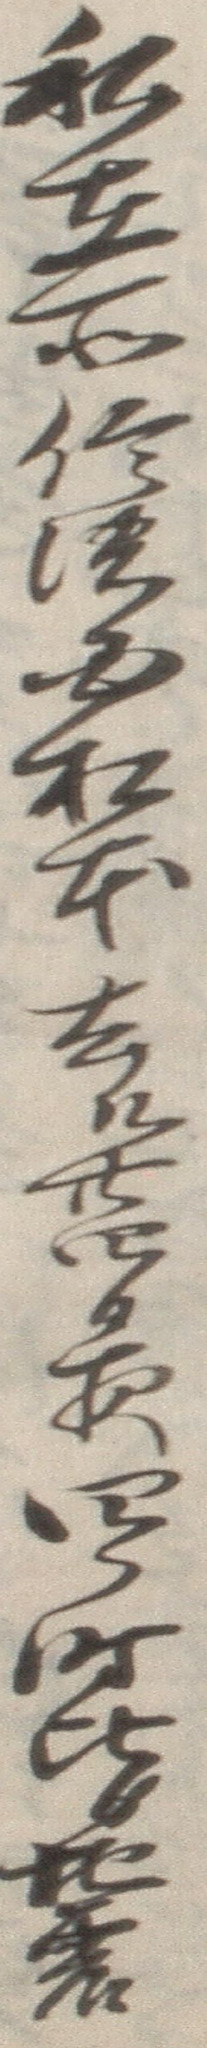私在所信州国松本去ㇽ廿四日夜四ッ時比ゟ地震
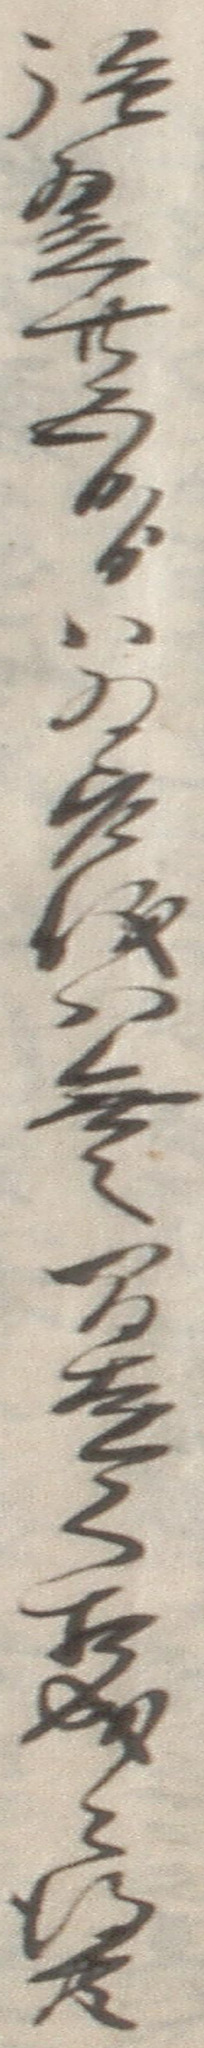強翌廿五日ゟハ為差儀ハ無之間遠く相成候得共
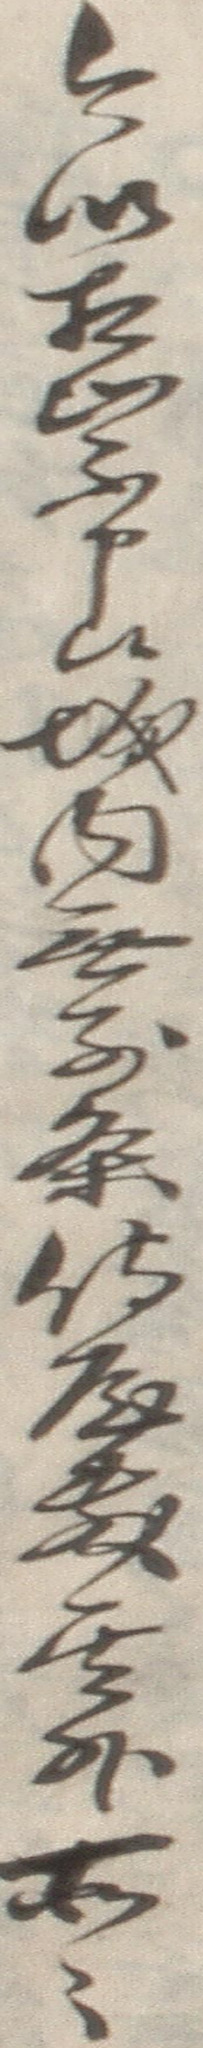今以相止不申候城内無別条侍屋敷其外所々
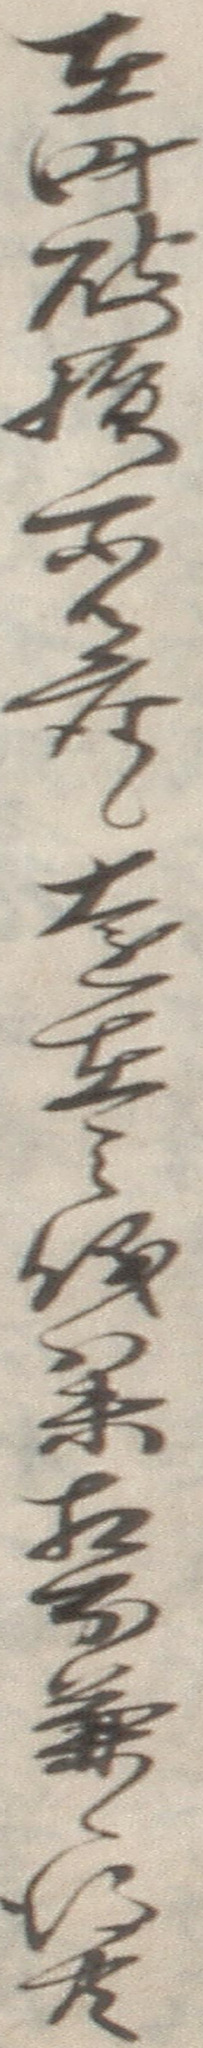在町破損所御座候遠在之儀ハ未相分兼候得共
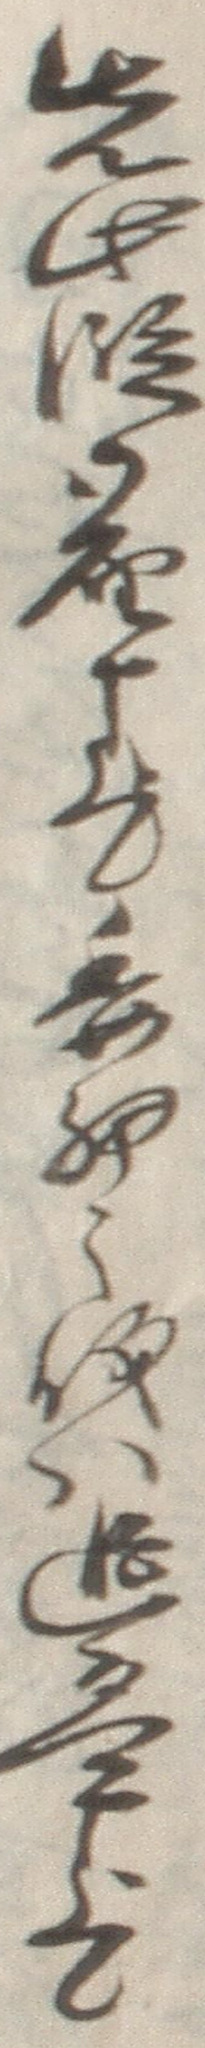先此段御届申上候委細之儀ハ追而可申上候
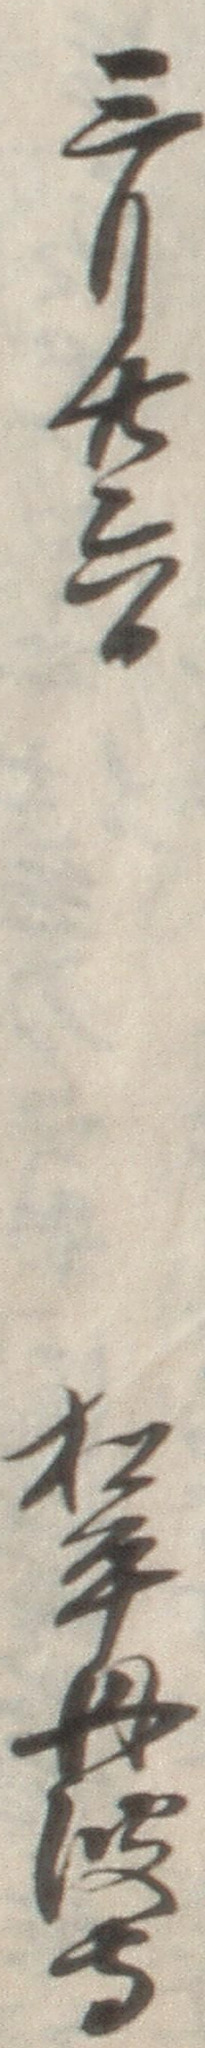三月廿六日松平丹波守
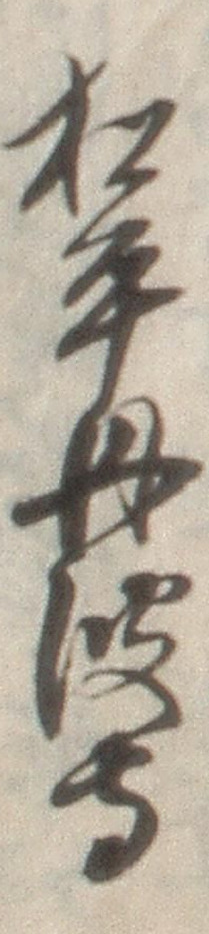三月廿六日松平丹波守
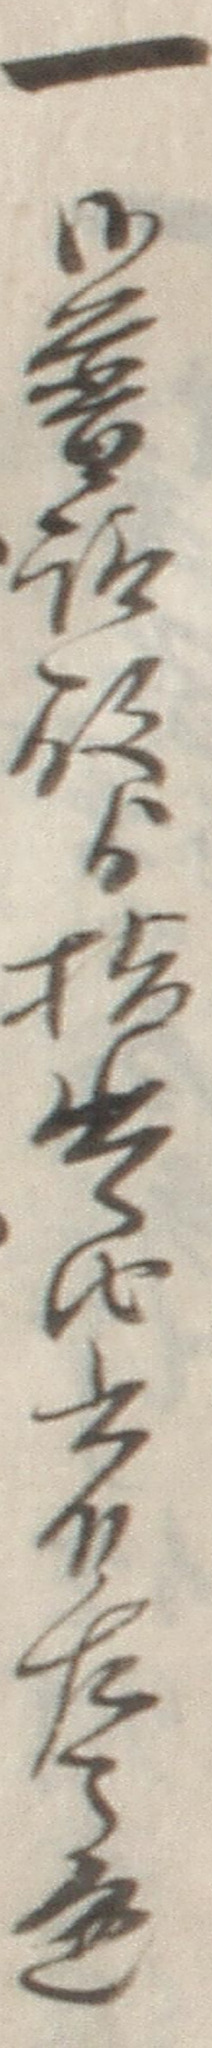一御普請役ゟ指出候由書付左之通
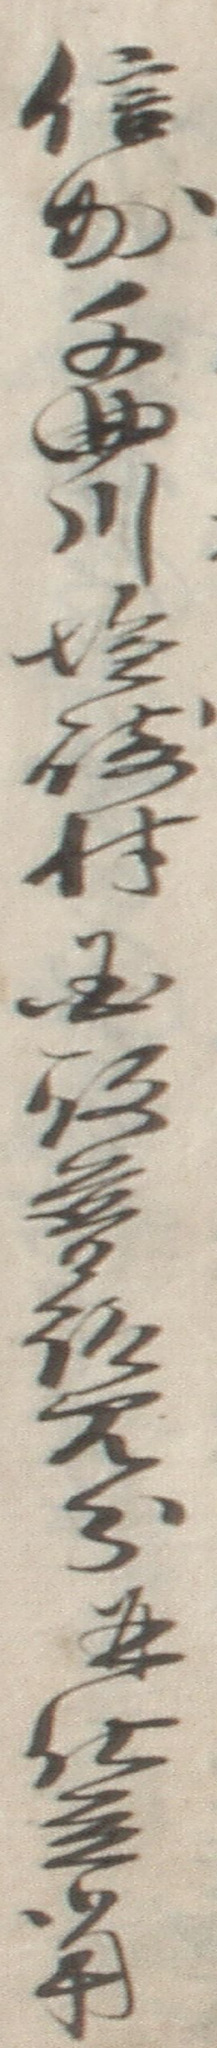信州千曲川塩崎村国役普請役見分并仕立御用

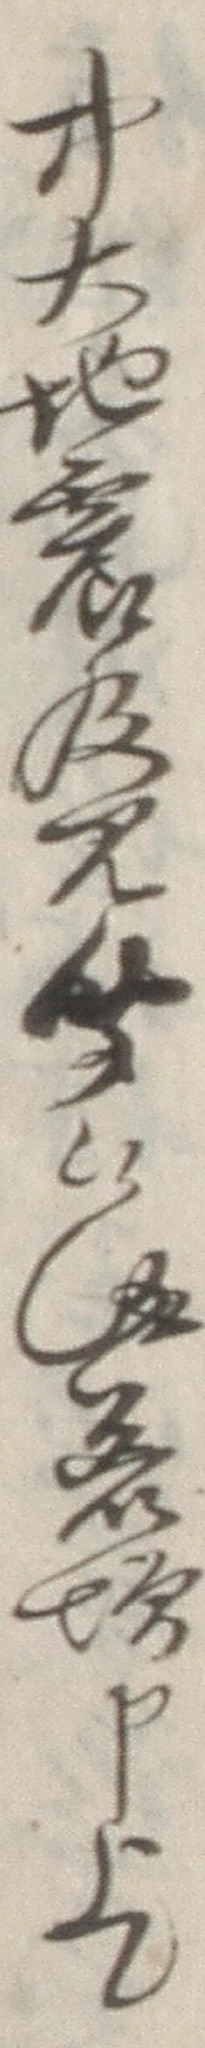大地震及見聞候趣荒増申上候
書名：信州地震一件
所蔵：東京大学地震研究所図書室 Earthquake Research Institute Library, The University of Tokyo, JAPAN
